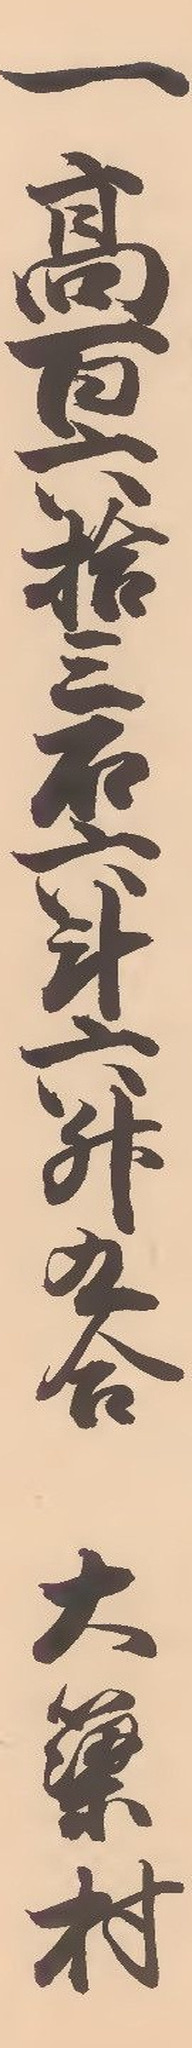一高百六拾三石六斗六升九合大簗村

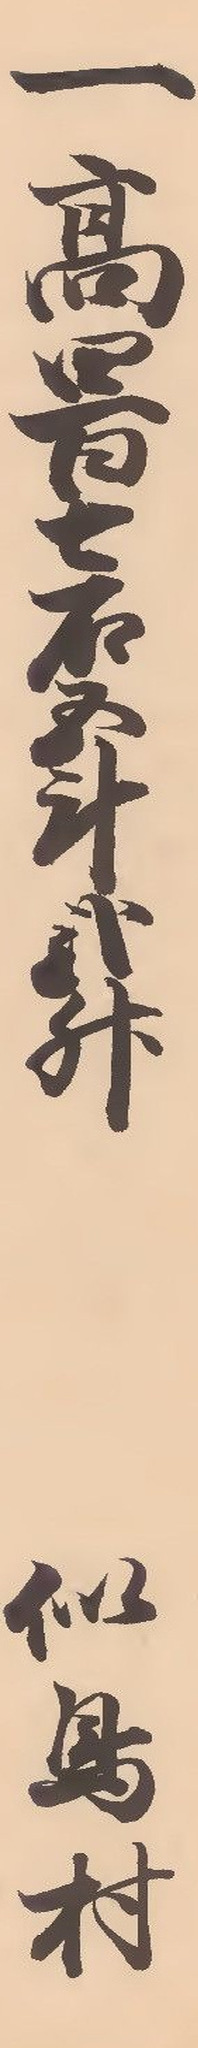一高四百七石五斗弐升似鳥村
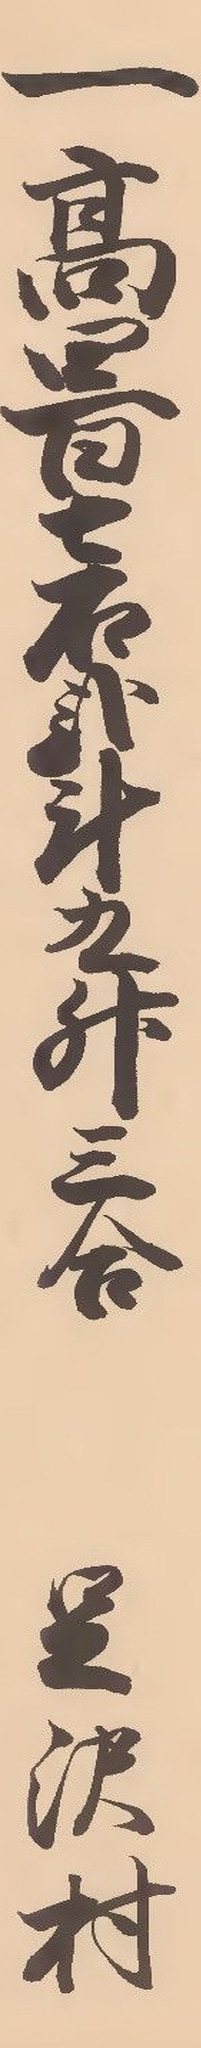一高四百七石弐斗九升三合足沢村
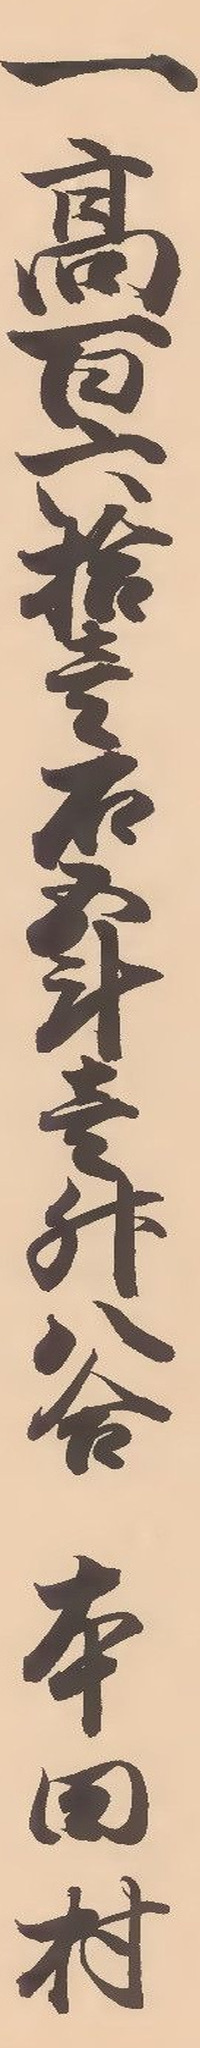一高百六拾壱石五斗壱升八合本田村
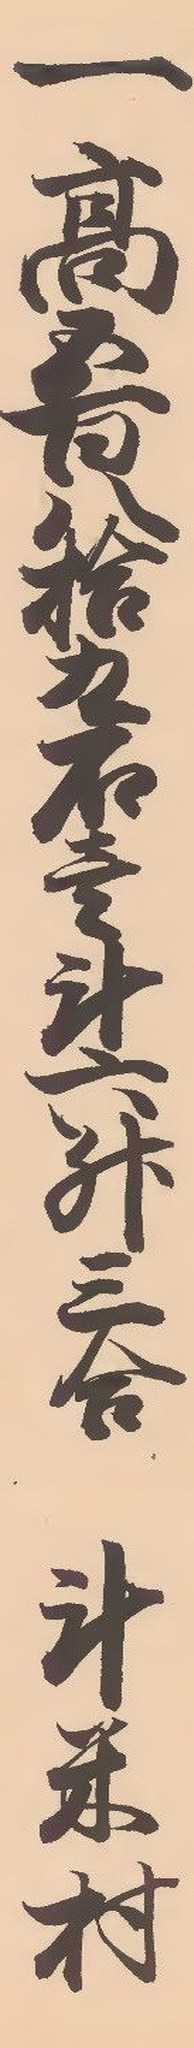一高五百八拾九石壱斗六升三合斗米村
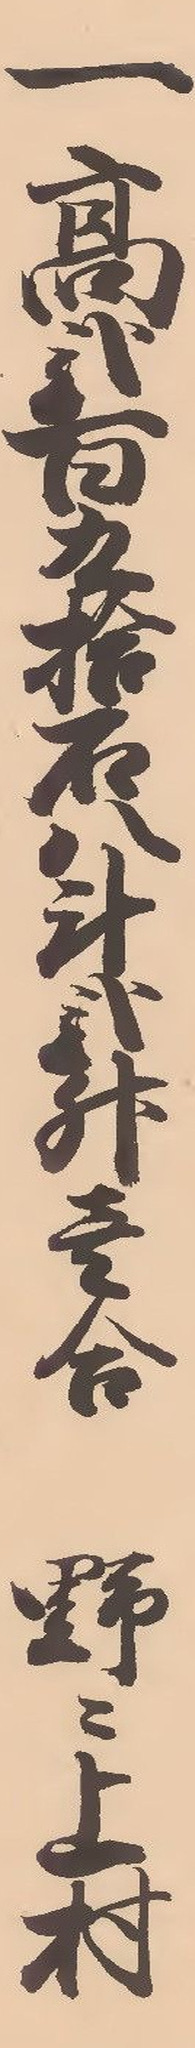一高弐百九拾石八斗弐升壱合野々上村
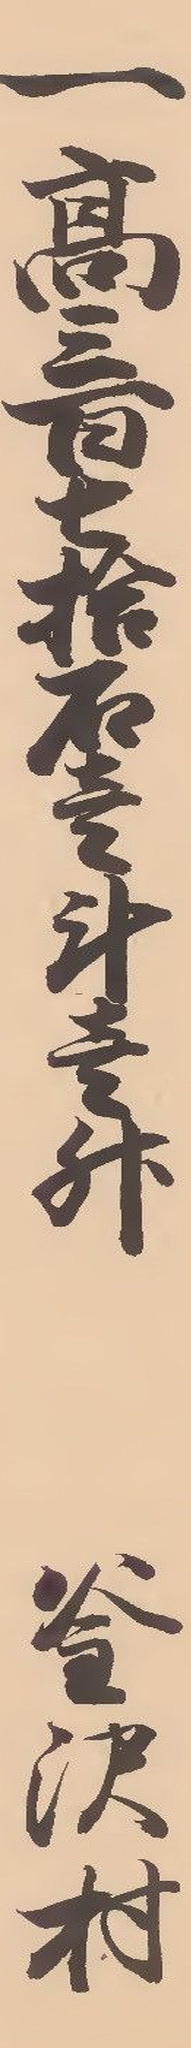一高三百七拾石壱斗壱升釜沢村
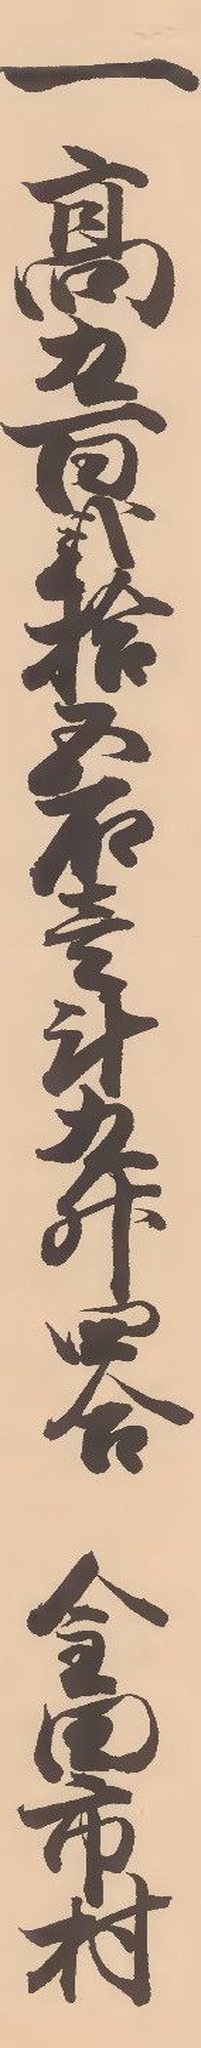一高九百弐拾五石壱斗九升四合金田市村
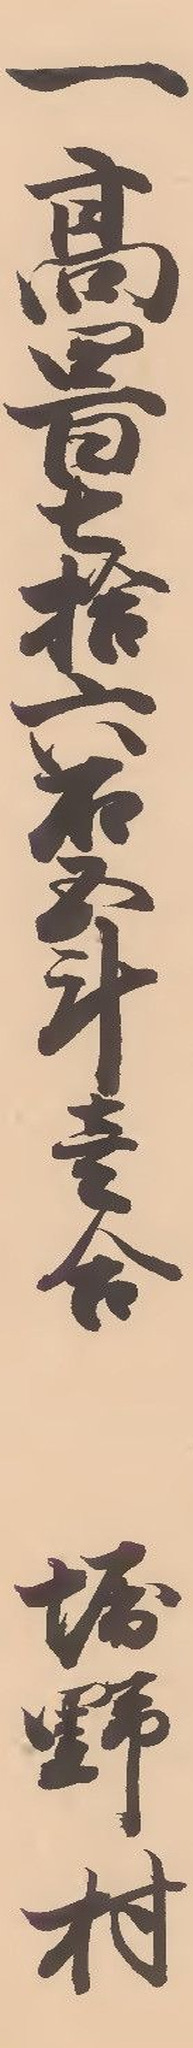一高四百七拾六石五斗壱合堀野村

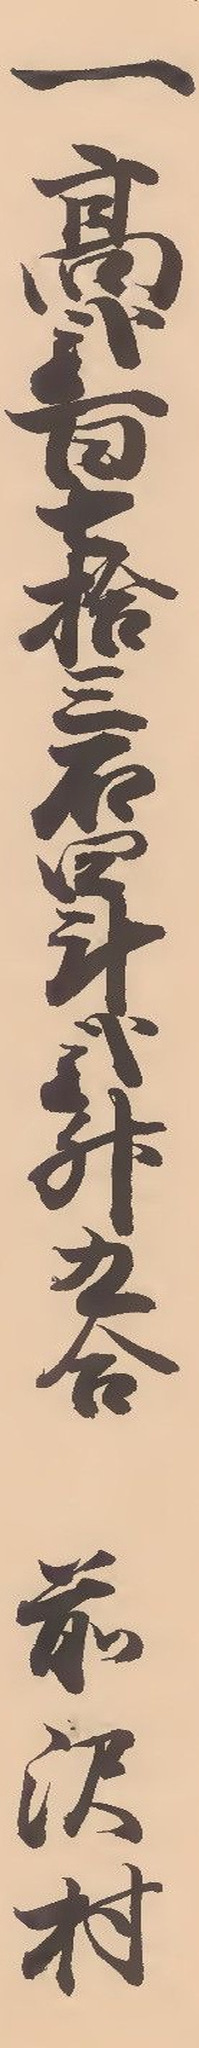一高弐百七拾三石四斗弐升九合前沢村
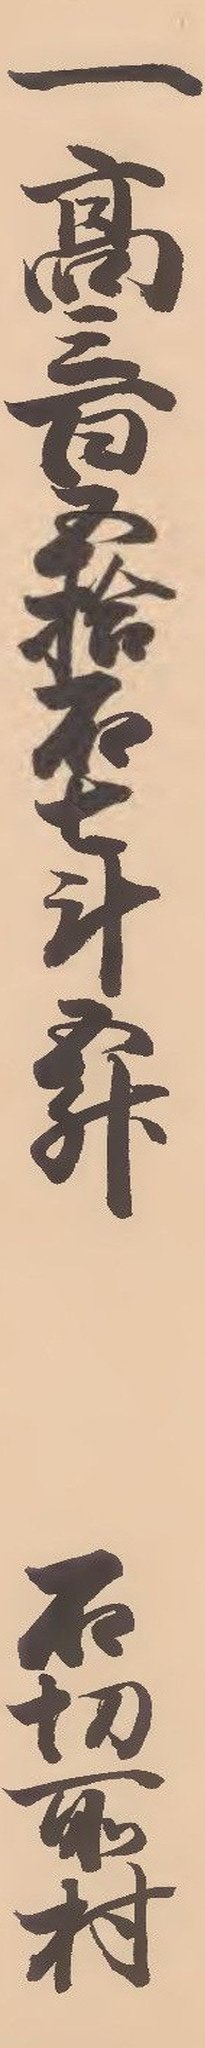一高三百五拾石七斗五升石切所村
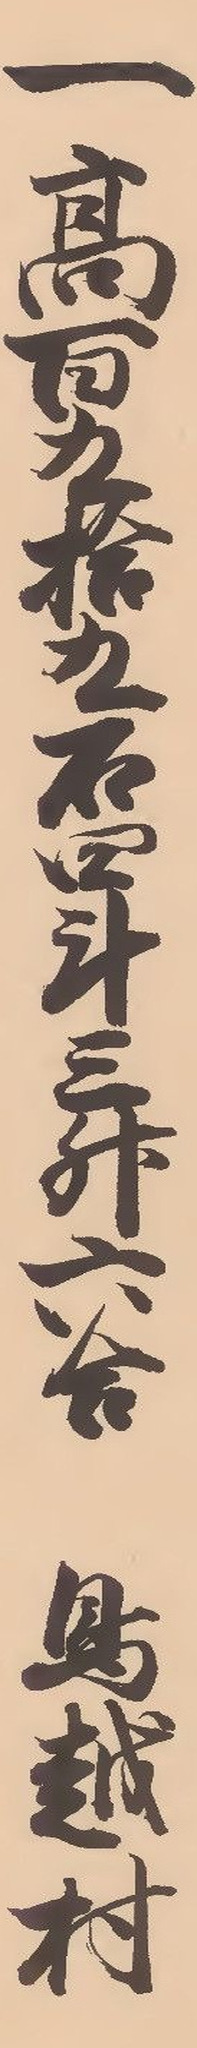一高百九拾九石四斗三升六合鳥越村
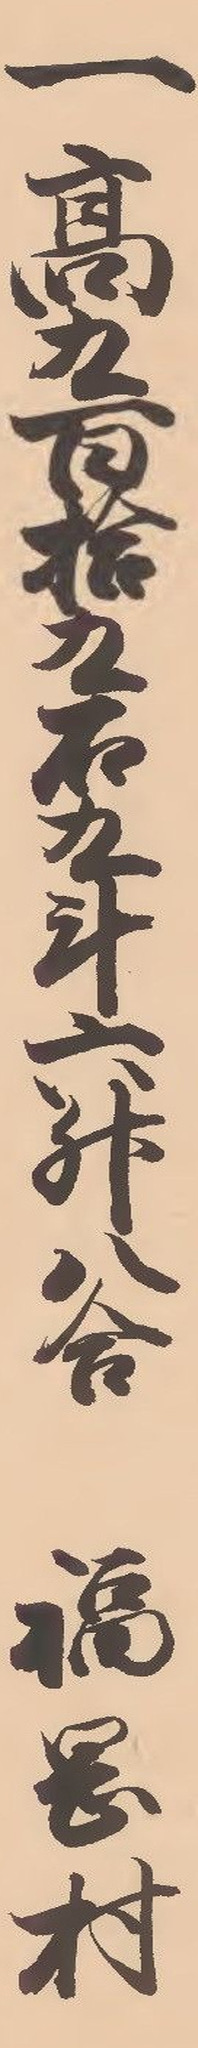一高九百拾九石九斗六升八合福岡村
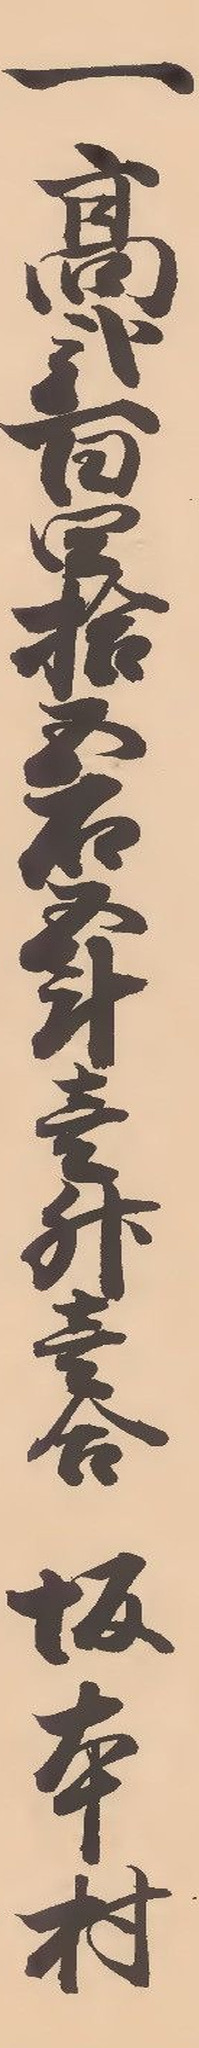一高弐百四拾五石五斗壱升壱合坂本村
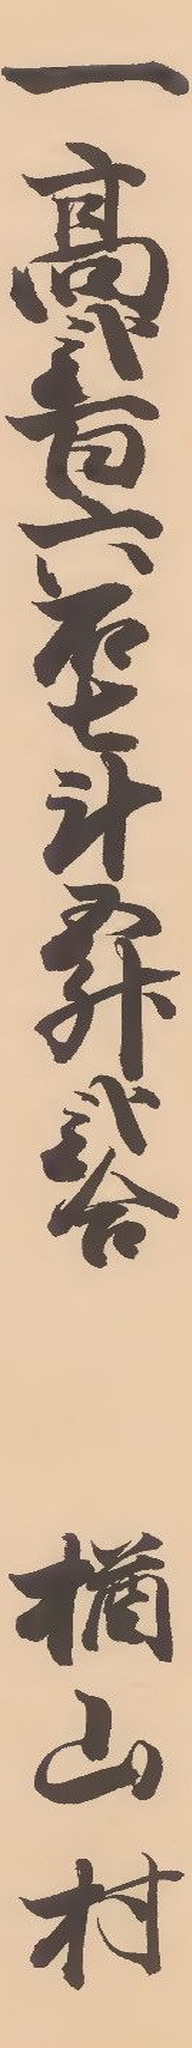一高弐百六石七斗五升弐合猶山村
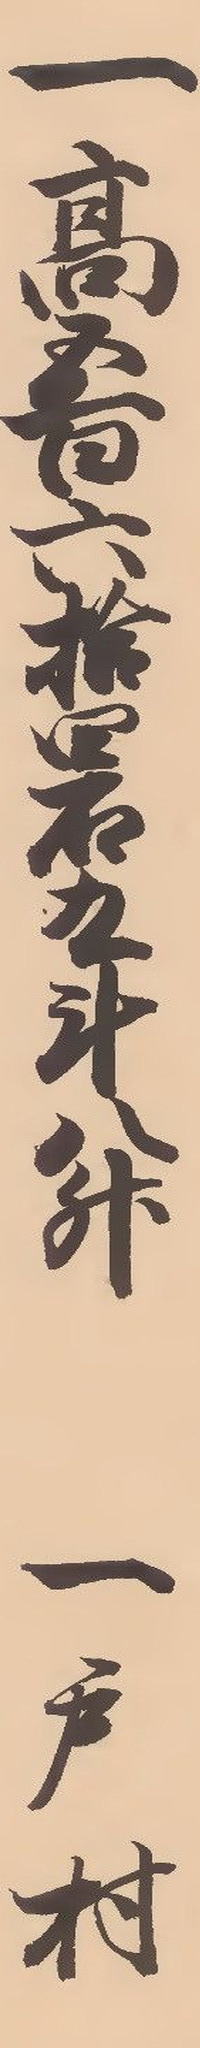一高五百六拾四石九斗八升一戸村
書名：陸奥国郷帳　６
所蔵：国立公文書館 National Archives of Japan
